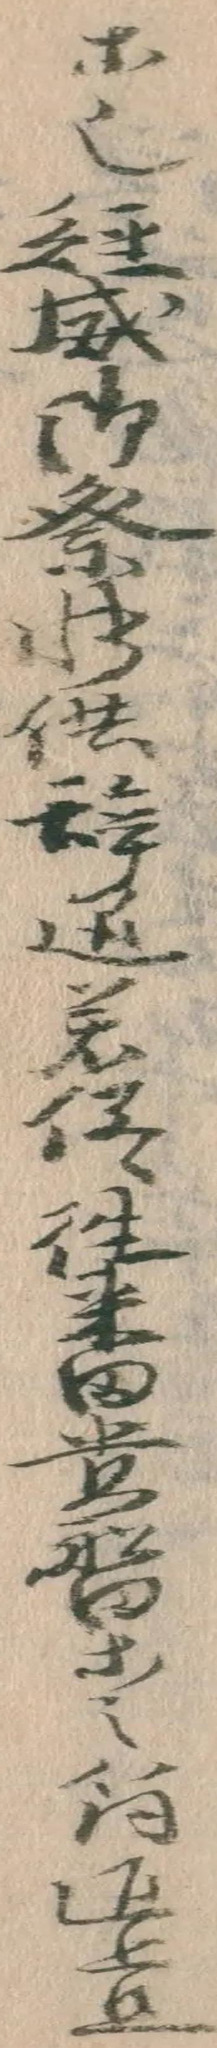等也経威御祭転供辞退若役へ往来田貴舩田等之筒返上且
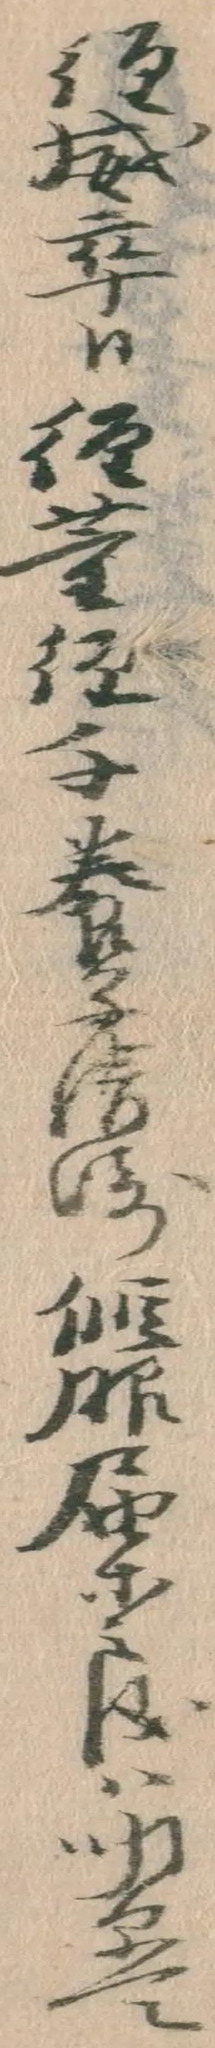経威卒日経董経千養子清崎仮服届等之儀ハ明而出也
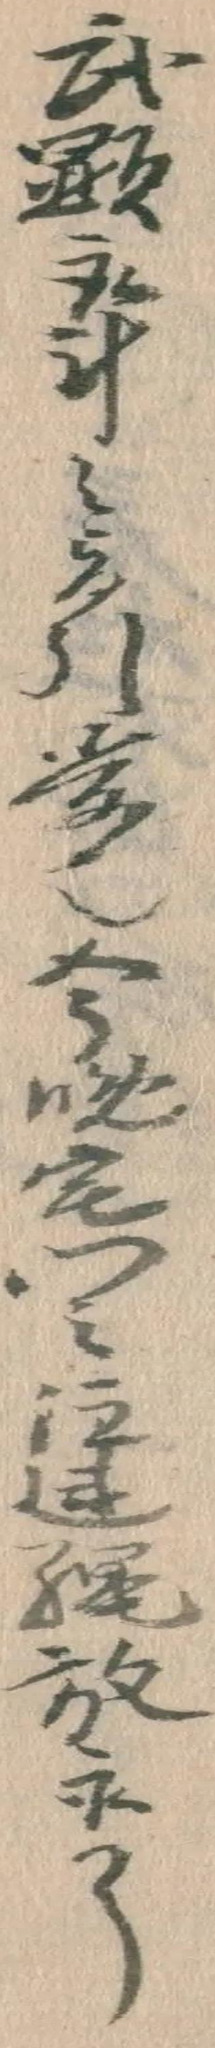武顕取斗之旨引當也今晩宅門之注進縄放取了
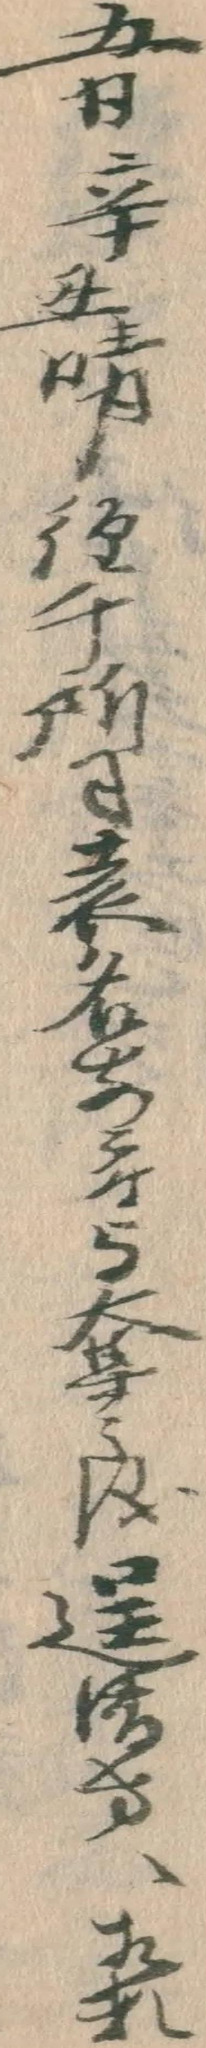五日辛丑晴経千所司表名前ニ付与奪之儀逞清方へ相頼
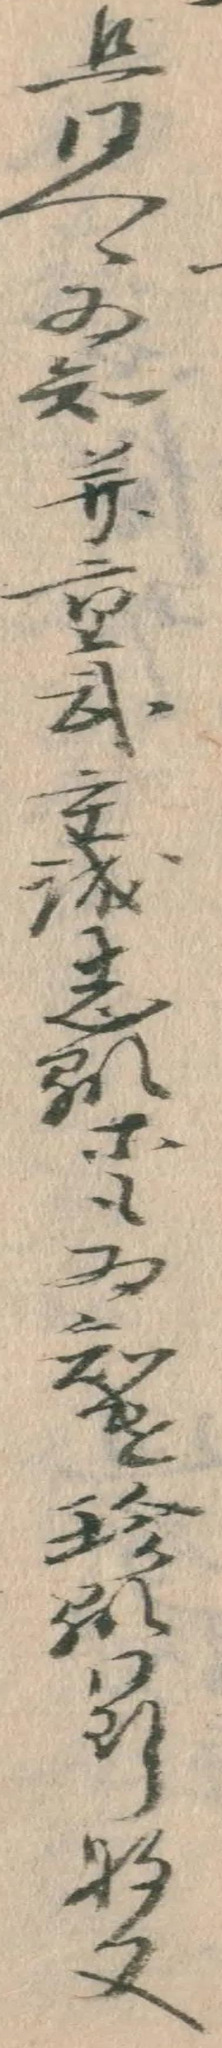且同人へ為知幷重武重誠志顕等も為知遣珍顕同断将又
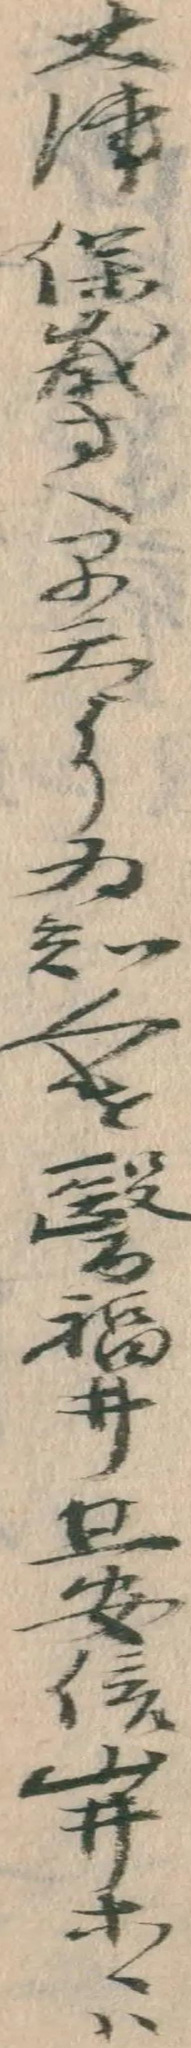大津保蔵方へ早天より為知人遣医福井且安倍山井等へハ
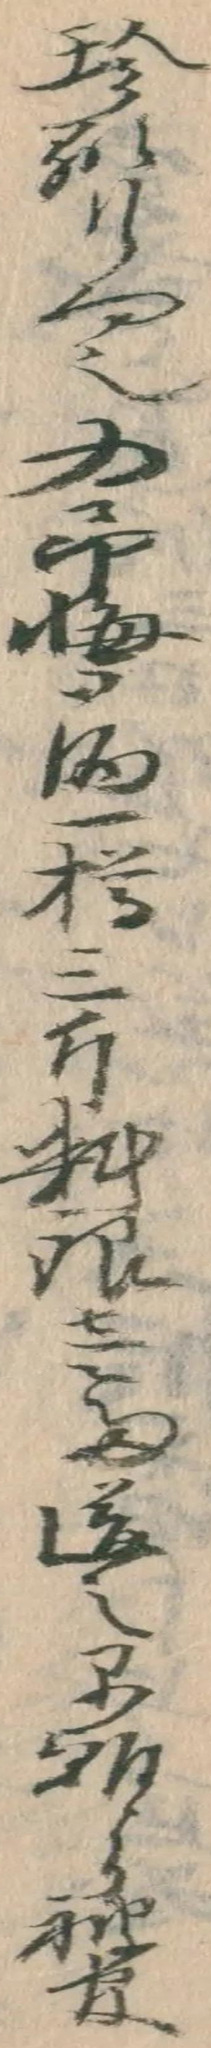珍顕行向也為弔悔御酒一樽三升料銀三両送之早朝より神官
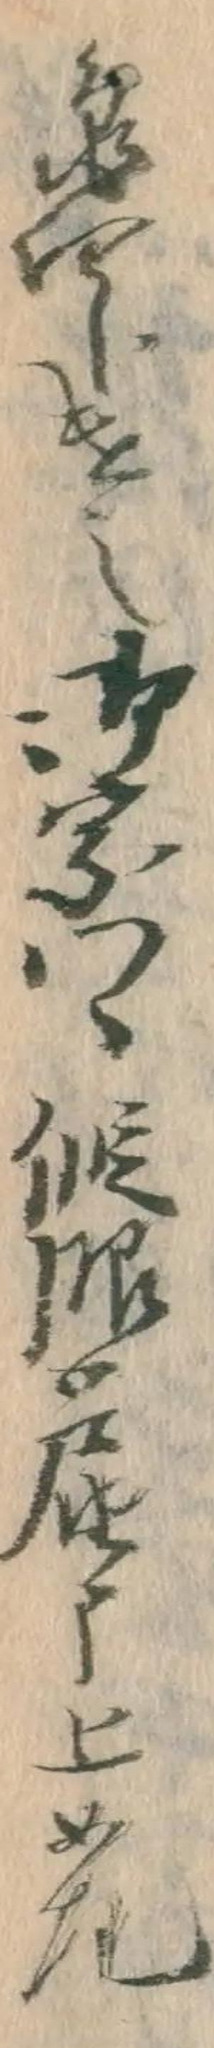亀四郎遣也御家門へ仮服御届申上如左

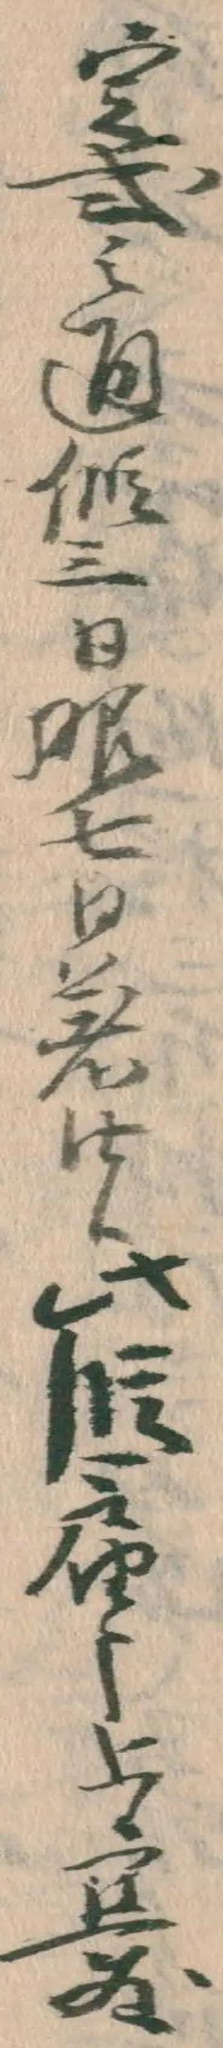定式之通仮三日服七日着仕候此段御届申上候宜敷
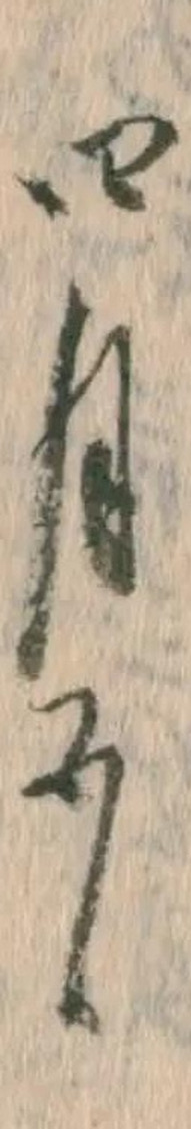四月五日
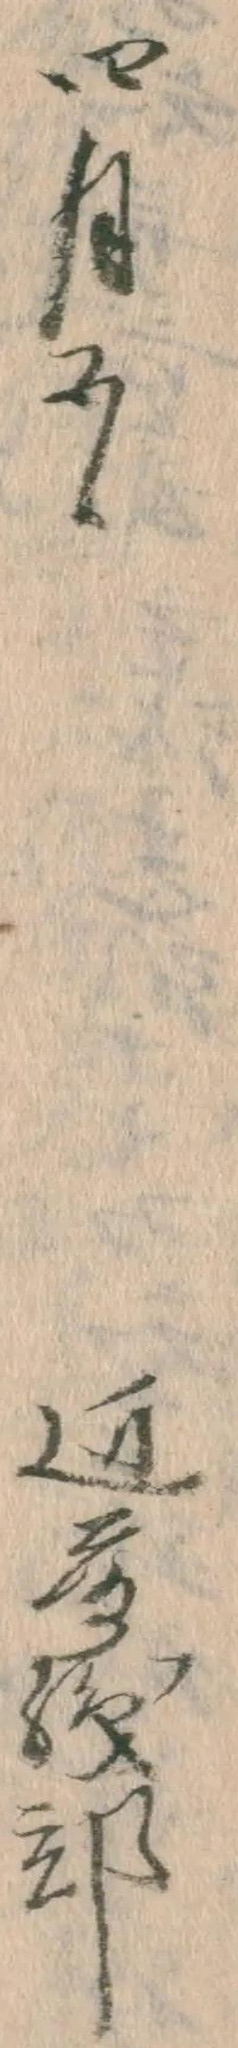四月五日近藤磯部
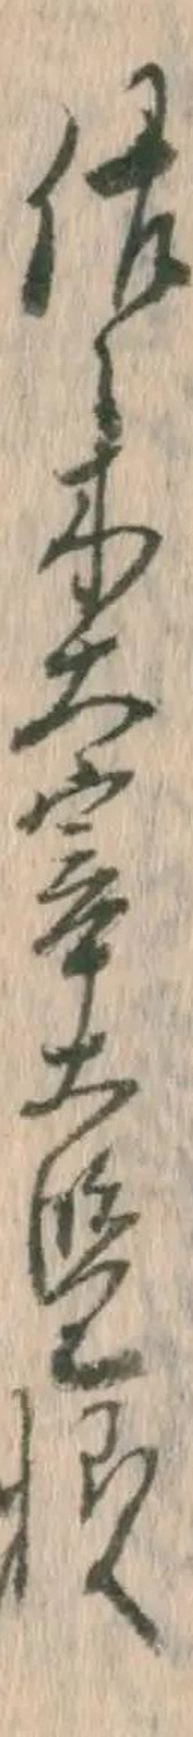佐々木大宰大監様
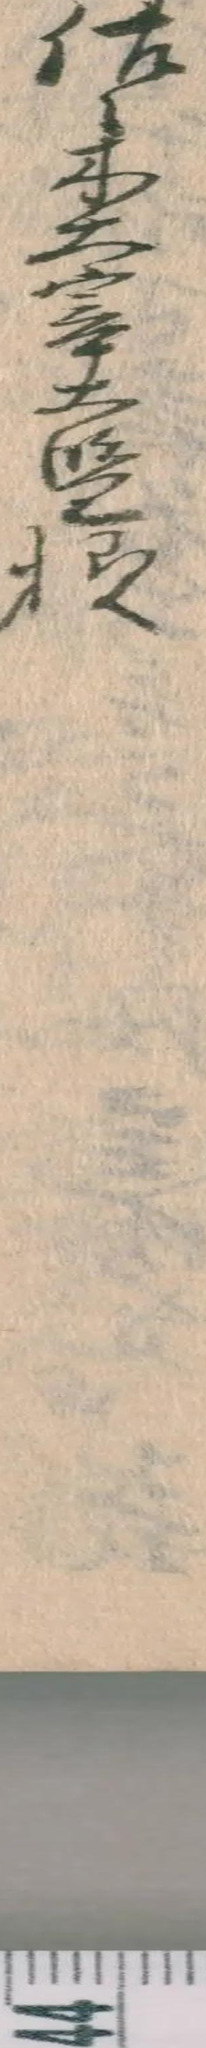佐々木大宰大監様
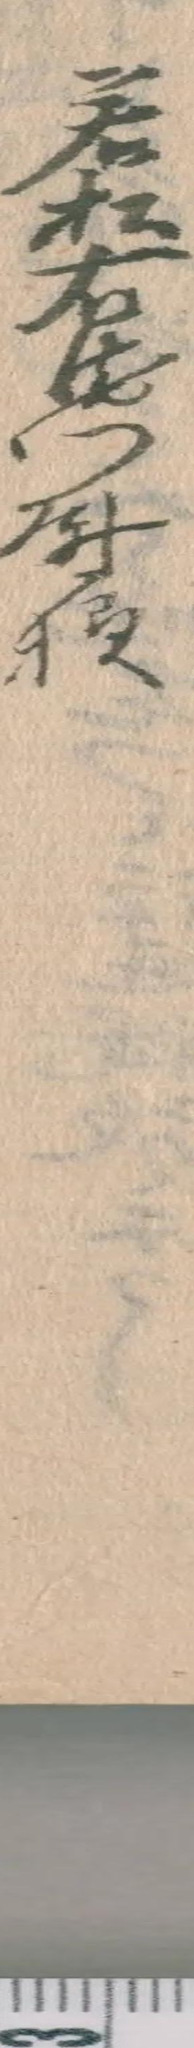若松右衛門尉様
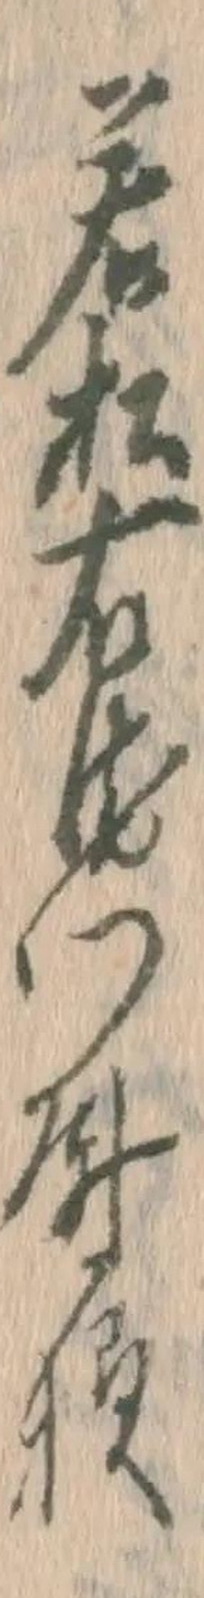若松右衛門尉様
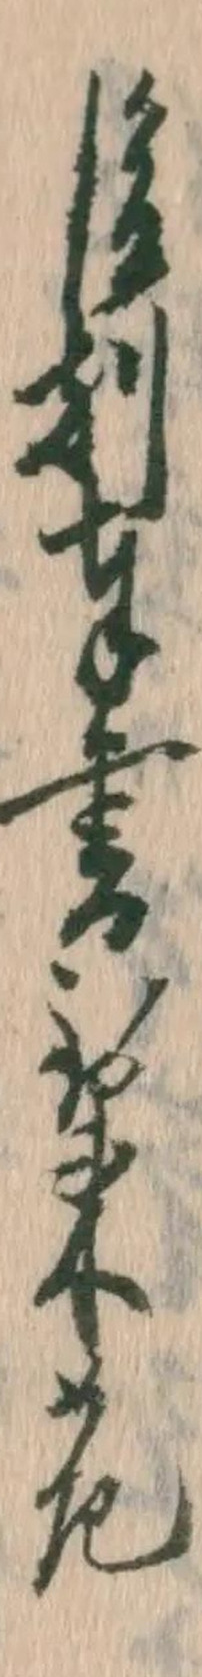後刻奉書到来如左
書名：賀茂社記録. 第69冊
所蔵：国立国会図書館 National Diet Library, JAPAN
